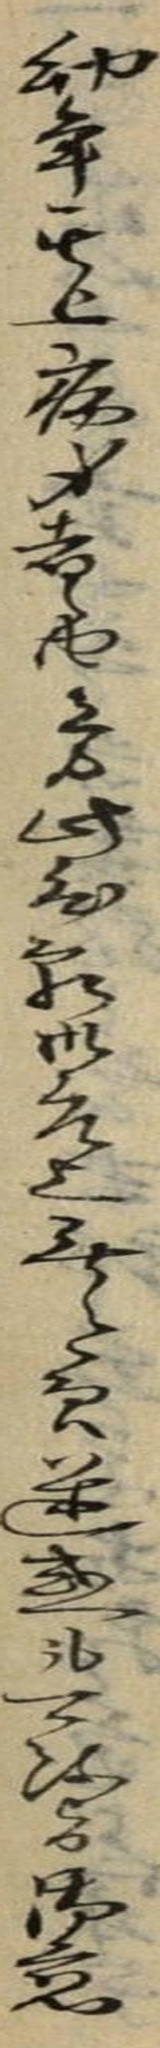幼年其上病身者之由旁此度願御取上無之候而迷惑も可致旨御慈
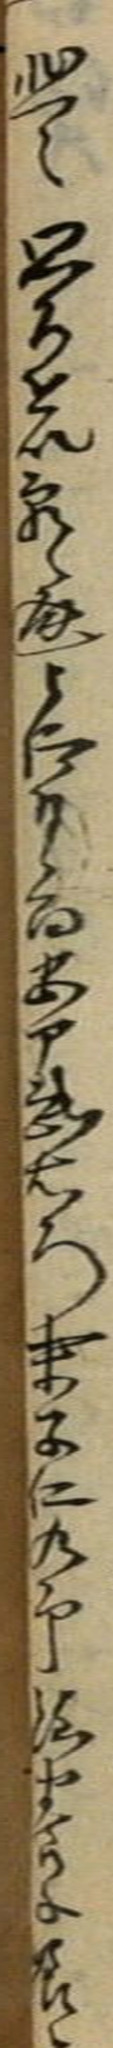悲之思召を以願之通被仰付候間安部武右衛門末子仁九郎仁九郎娘と
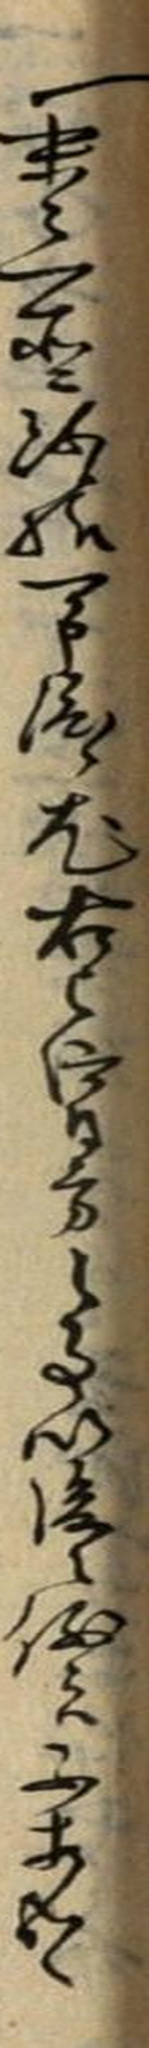末々一所ニ致候様可申渡候尤右被仰付方之事以後之例ニハ不相成候
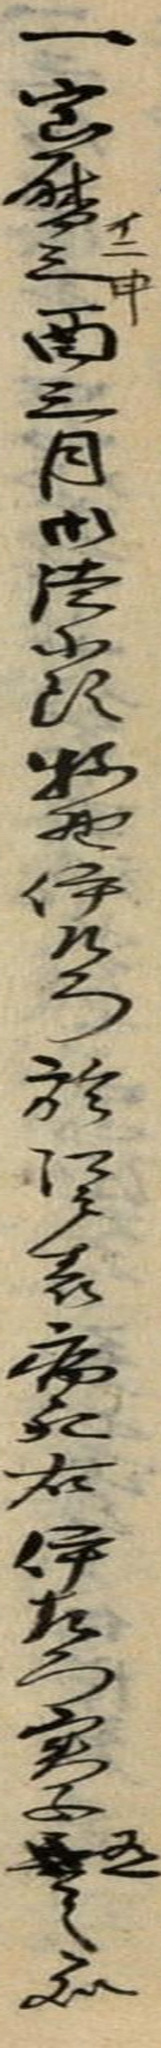一宝暦三酉三月御徒小頭牧野伊左衛門於江戸表病死右伊左衛門実子有之処
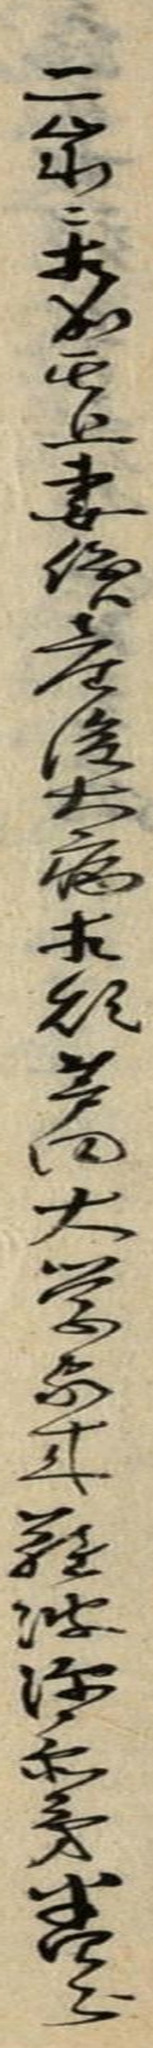二歳ニ相成其上妻儀ハ産後大病相煩芦田大学家来難波源兵衛弟半四郎
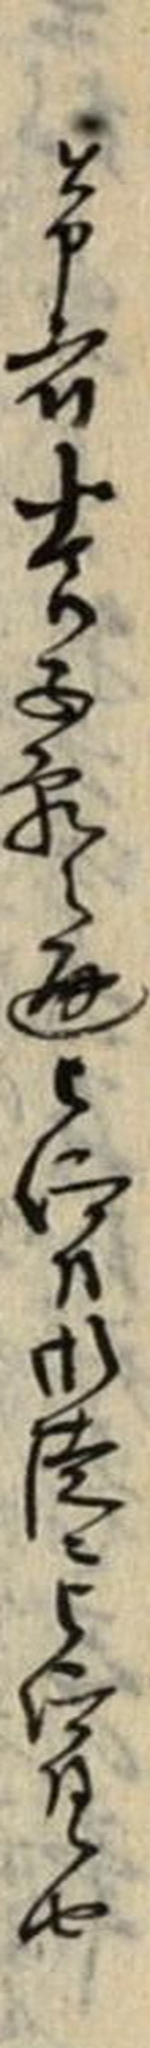と申者養子願之通被仰付御徒ニ被仰付候由
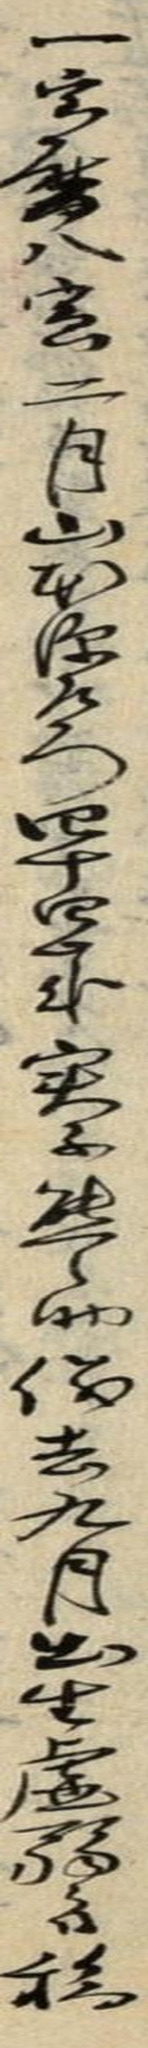一宝暦八寅二月山本源左衛門四十四歳実子熊之助儀去九月出生虚弱ニ付稲
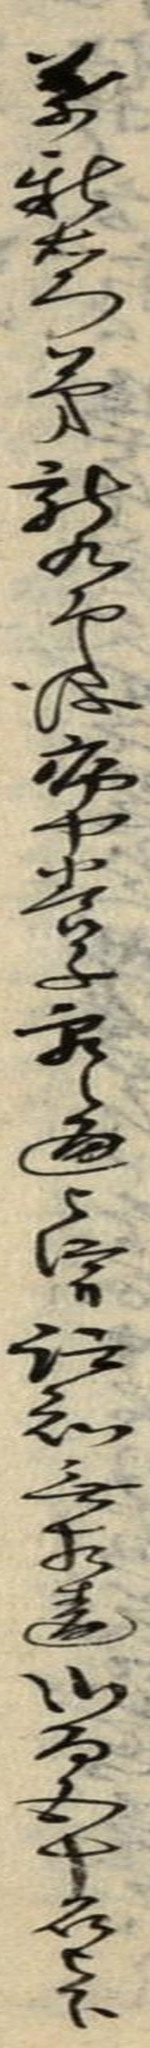葉新右衛門弟新九郎儀病中養子願之通跡知無相違弐百五十石被下
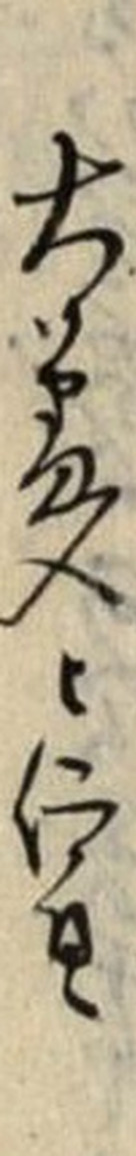大御番入被仰付候
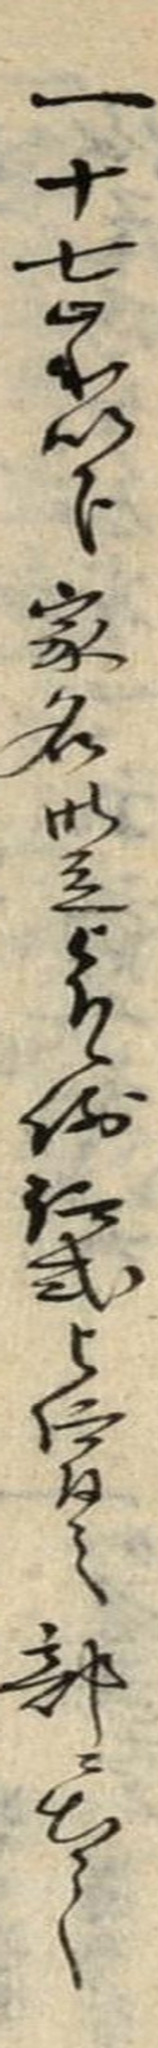一十七歳以下家名御立被下候例跡式被仰付之部ニ出之
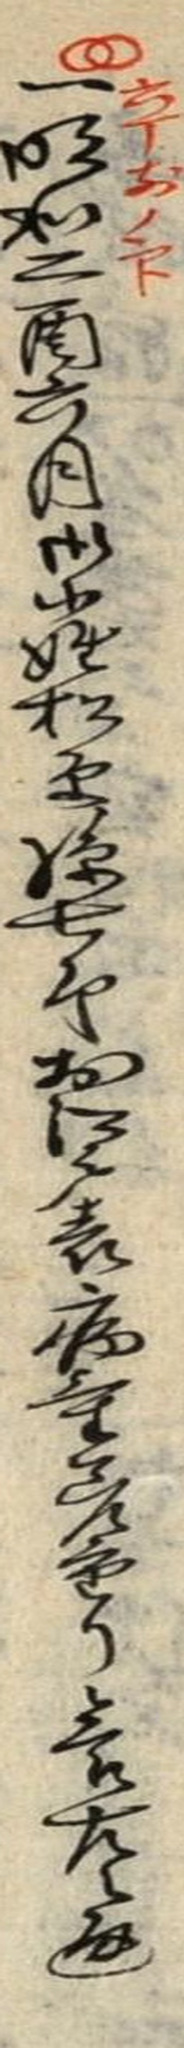一明和二酉六月御小姓松原孫七郎於江戸表病気差重候節左之通
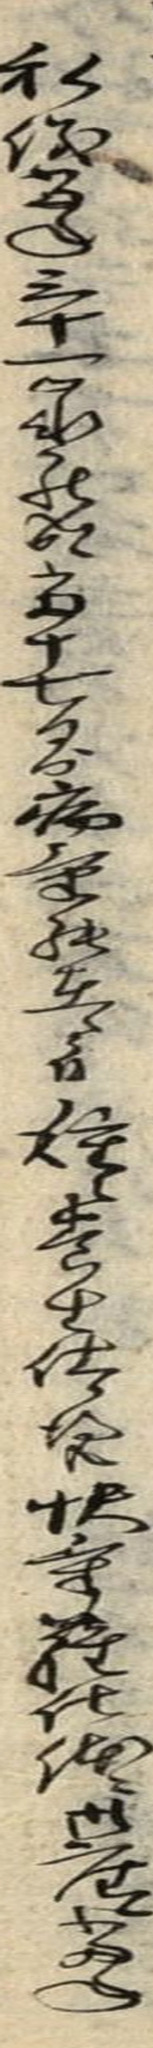私儀当年三十一歳罷成候当十七日ゟ病気在候ニ付種々養生仕候得共快気難仕体ニ御座候当年
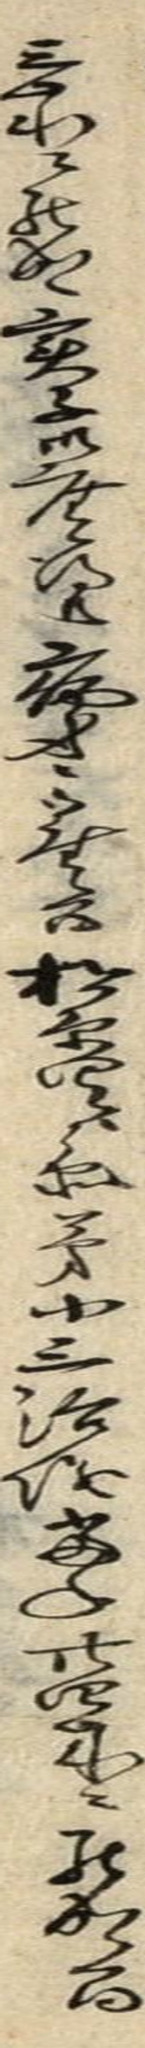三歳ニ相成候実子御座候得共病身ニ御座候間松原四郎兵衛弟小三治儀当年廿四歳ニ相成候間
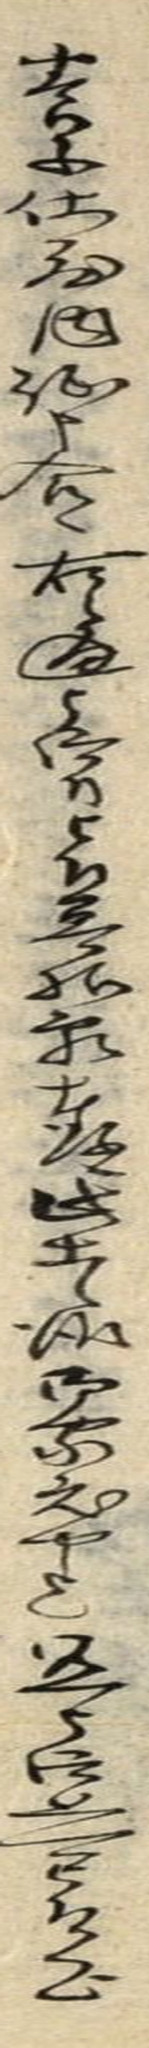養子仕度内証申合候右之通被仰付被下置候様願奉存候此等之儀御家老中迄宜被仰上可被下候以上
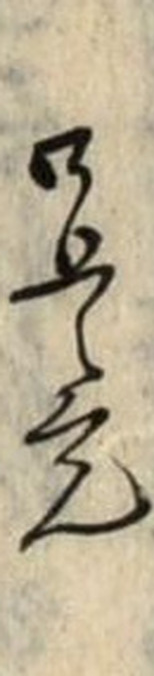口上之覚
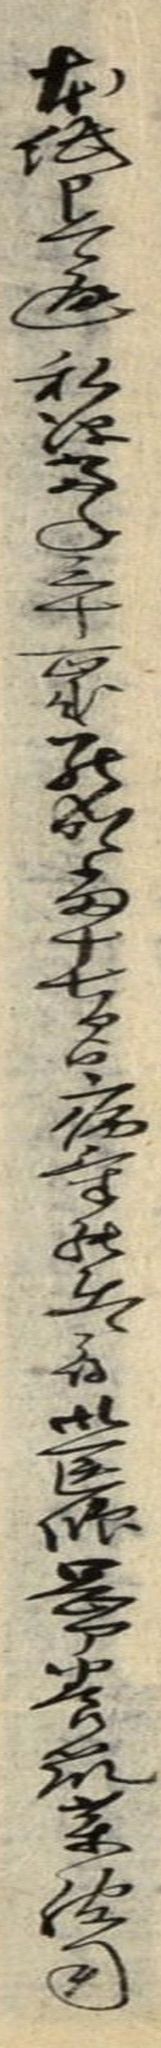本紙申上候通私儀当年三十一歳罷成候当十七日ゟ病気罷在候ニ付御医師岡部養筑薬服用
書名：養子縁組之部
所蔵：福井県文書館 Fukui Prefectural Archives
